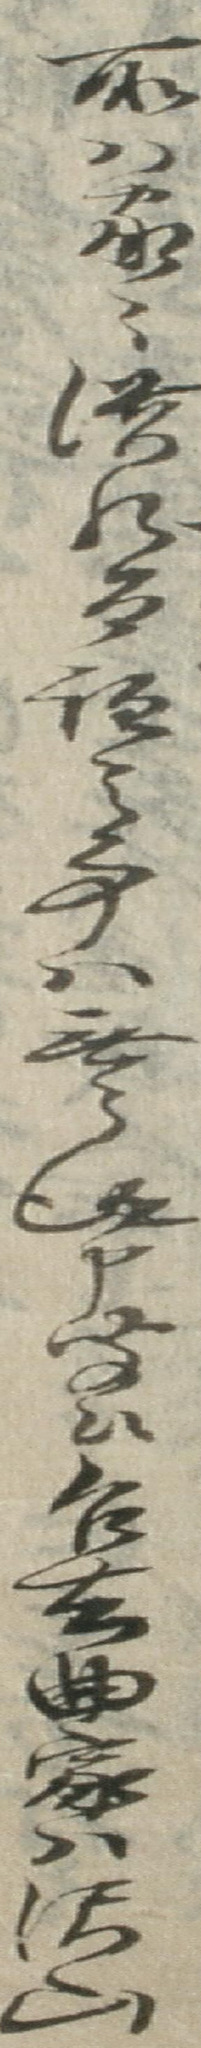所ハ家々潰れる程之事ハ無之趣申聞候乍去曲家ハ沢山
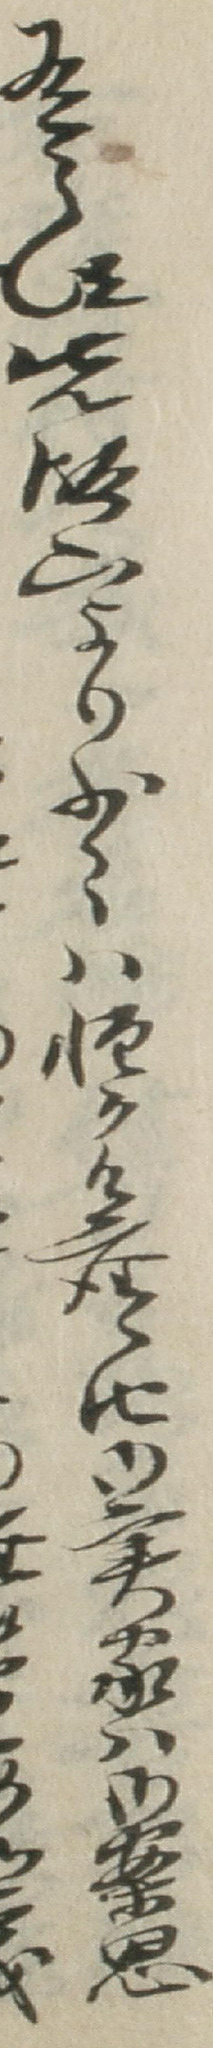有之趣先飯山よりハ少々軽ク御座候由御実家ハ御案思
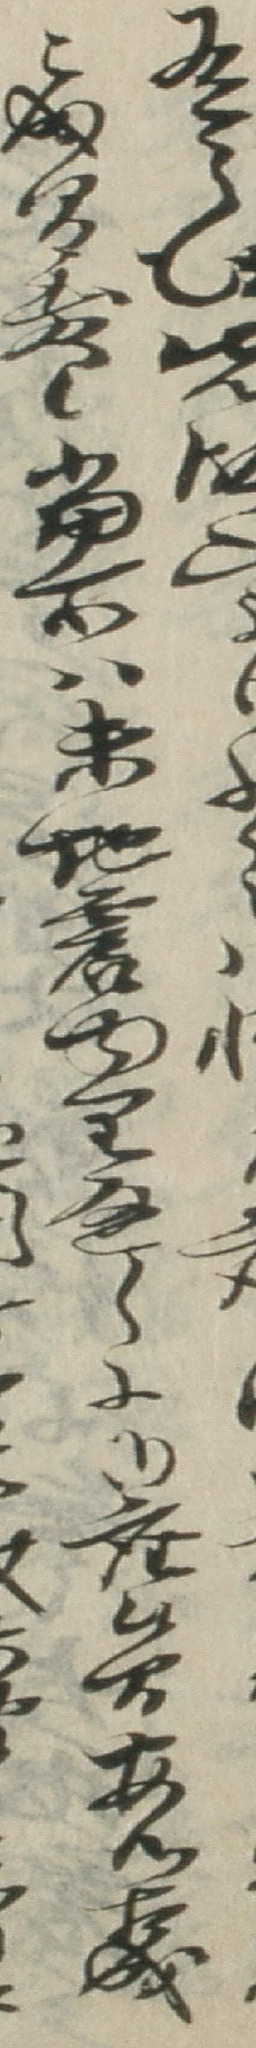二成間敷候当所ハ未地震ゆり通しに御座候間安心相成
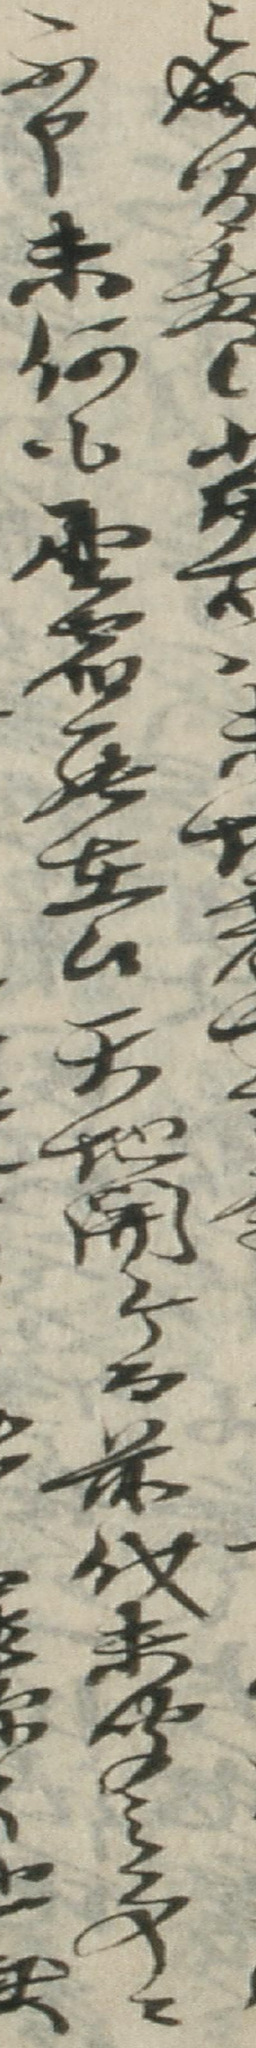不申未何も野宿罷在候天地開ヶ而前代未聞之事二
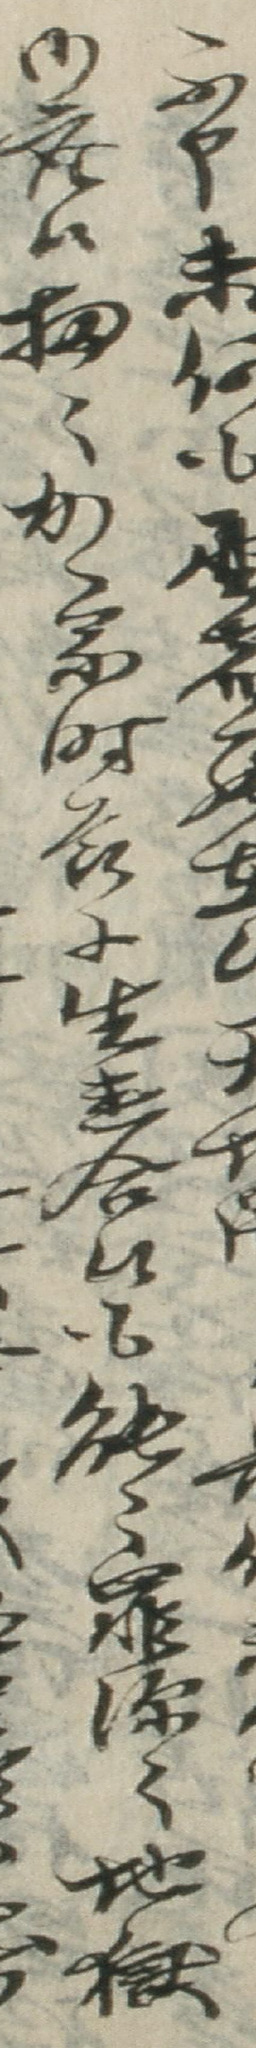御座候猶々かゝる時節に生れ合候も能々罪深く地獄
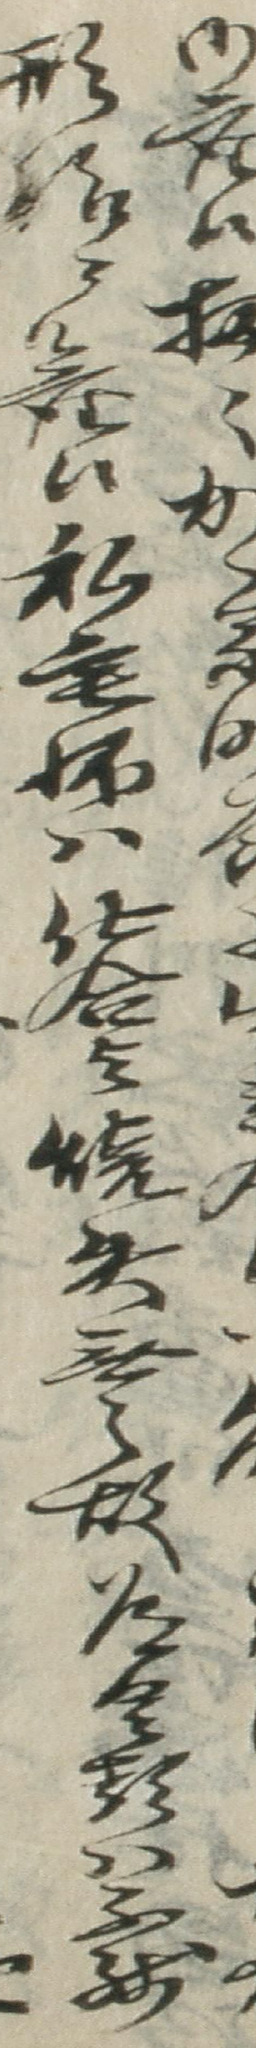形様二御座候私宅抔ハ仕合と焼失無之故道具類ハ不残
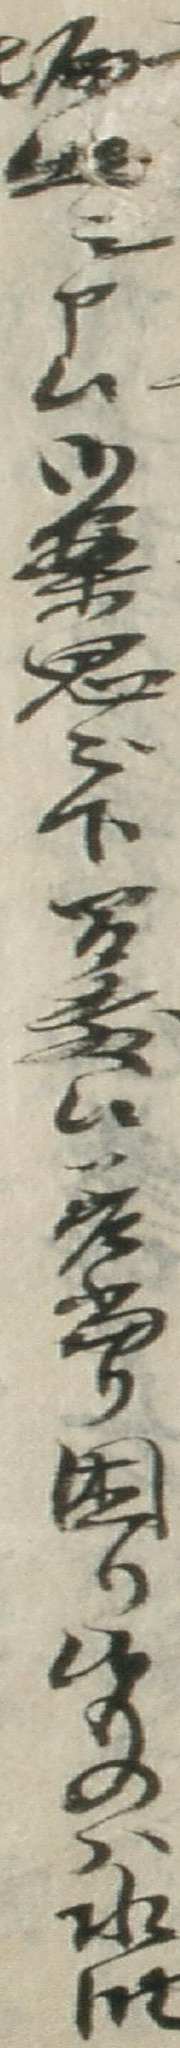堀出ㇱ申候御案思被下間敷候差当り困り候ものハ水油
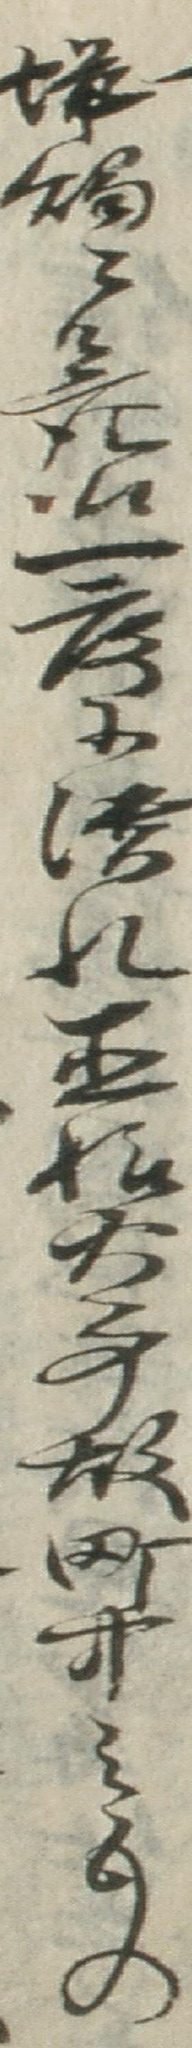蝋燭二御座候一度に潰れ直様火事故町中之もの
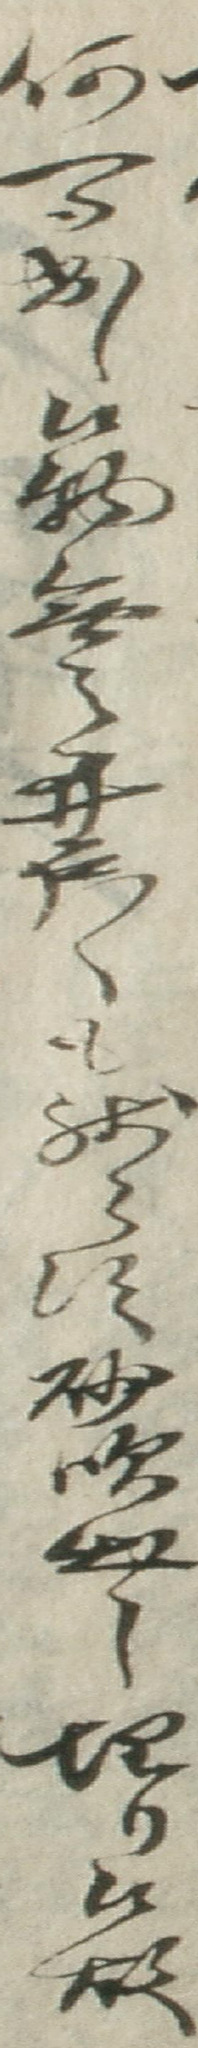何一ッ出し候物無之井戸〳〵も残らす砂吹出し埋り候故
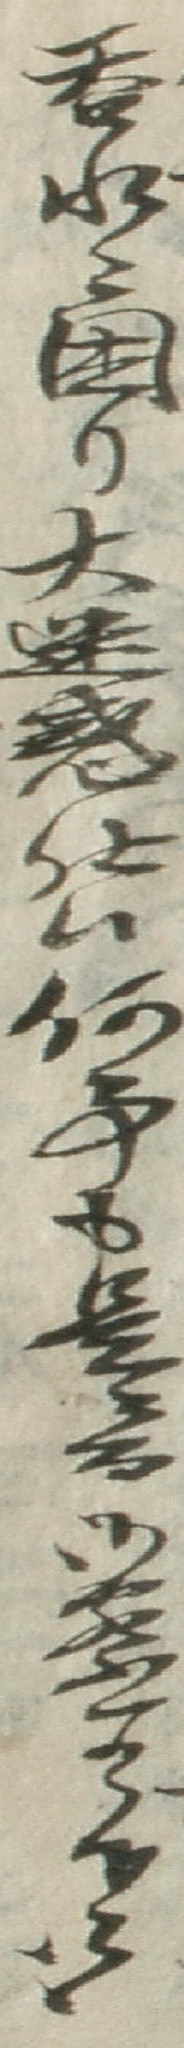吞水二困り大迷惑仕候何事も是二而御察可被下候以上
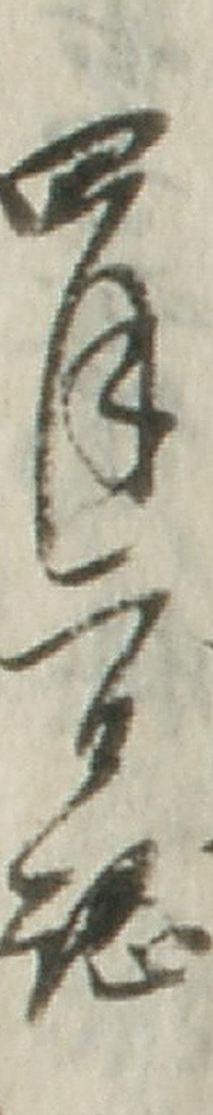四月二日認
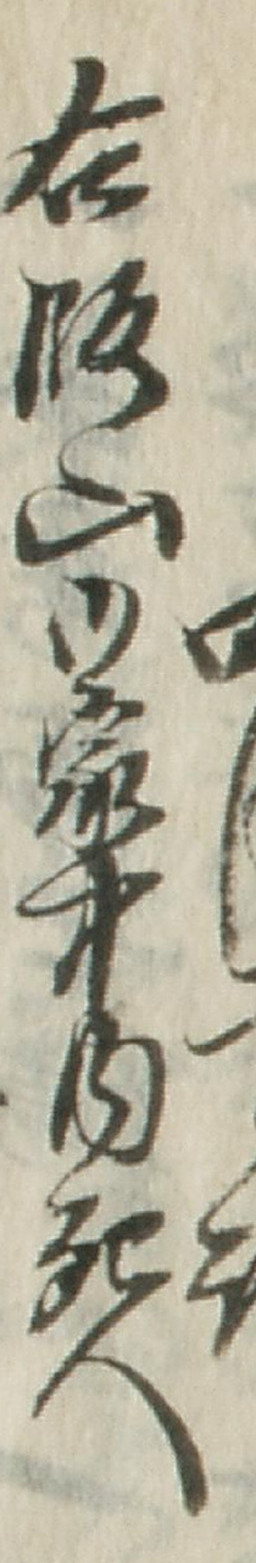右飯山御家中内死人

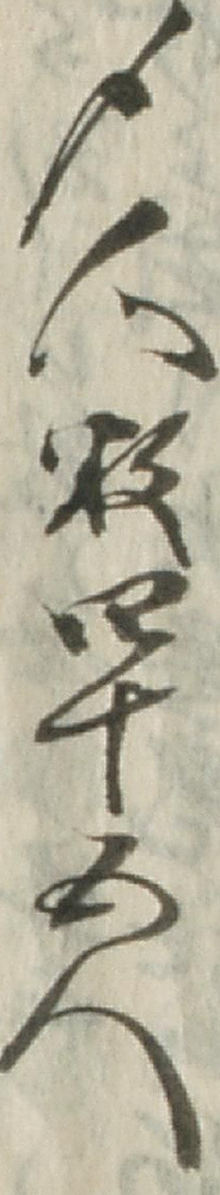〆人数四十五人
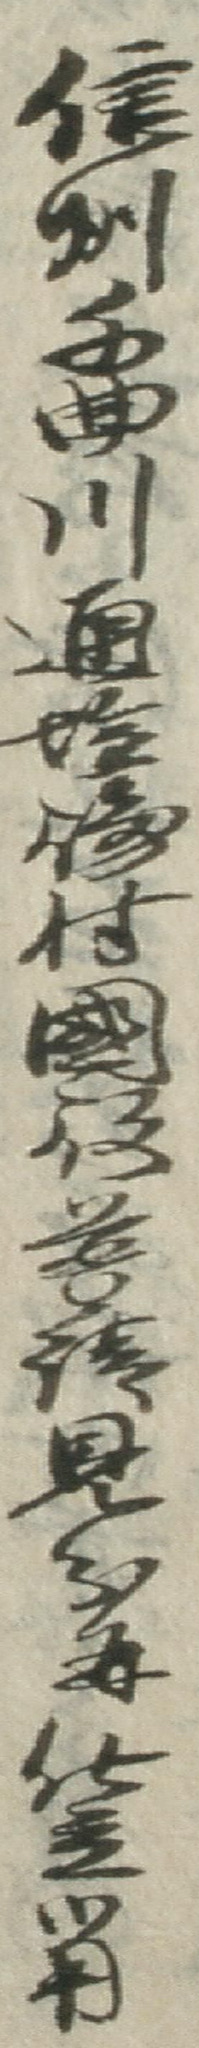信州千曲川通塩崎村国役普請見分幷仕立御用
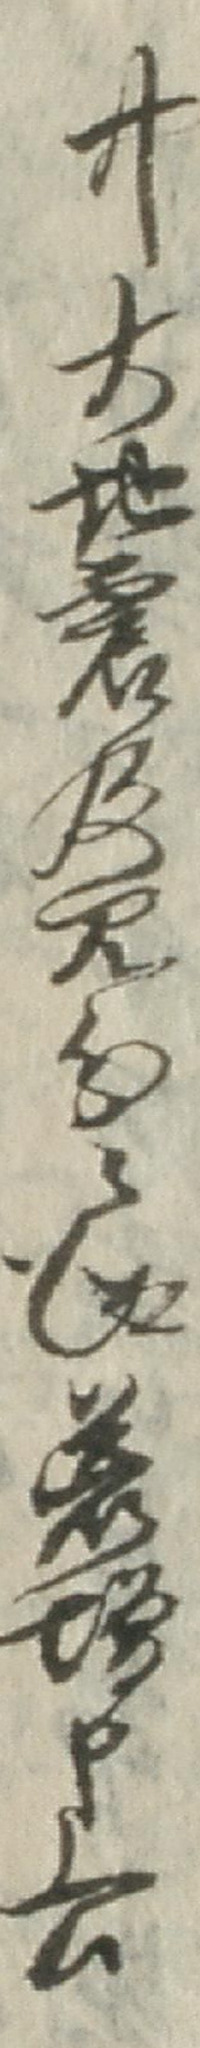中大地震及見分候趣荒増申上候
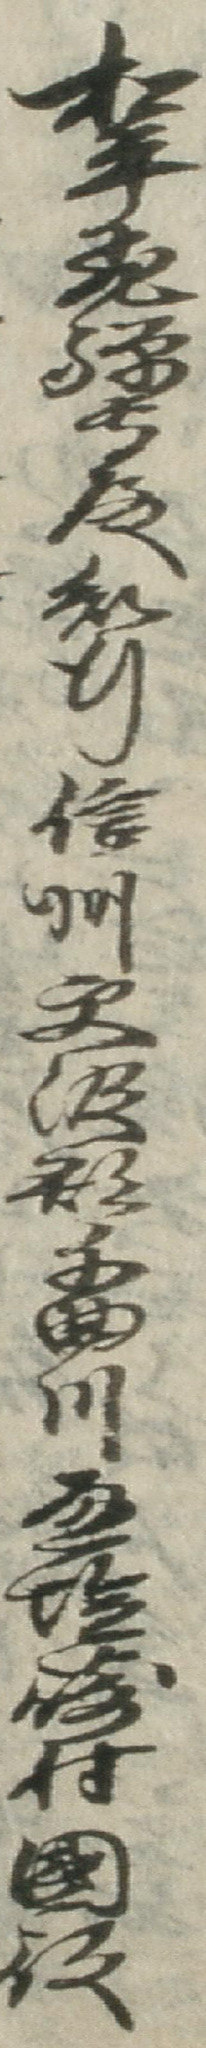松平飛驒守殿知行信州更級郡千曲川通塩崎村国役
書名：信濃國地震實録記
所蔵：東京大学地震研究所図書室 Earthquake Research Institute Library, The University of Tokyo, JAPAN
